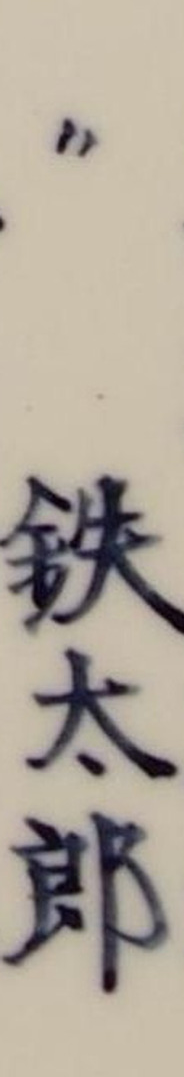鉄太郎
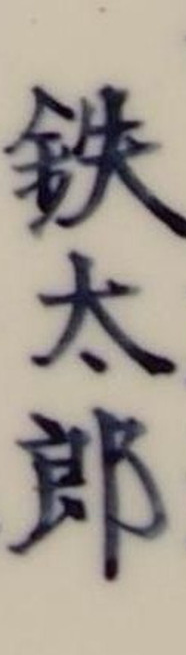鉄太郎
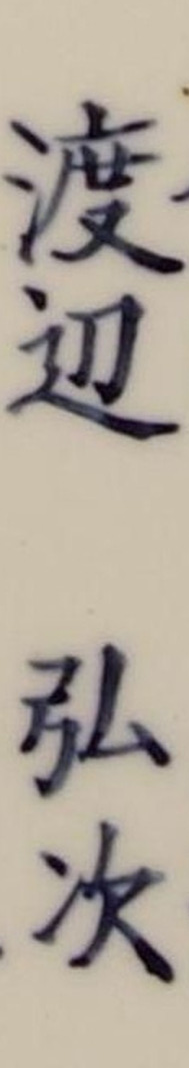渡辺弘次
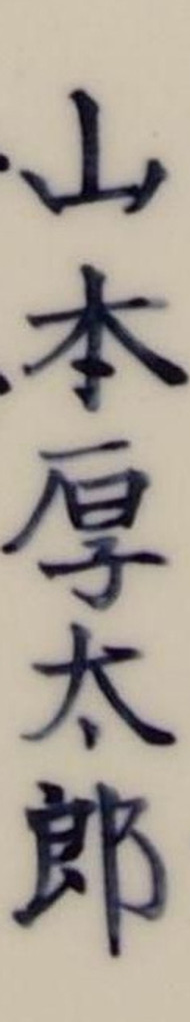山本厚太郎
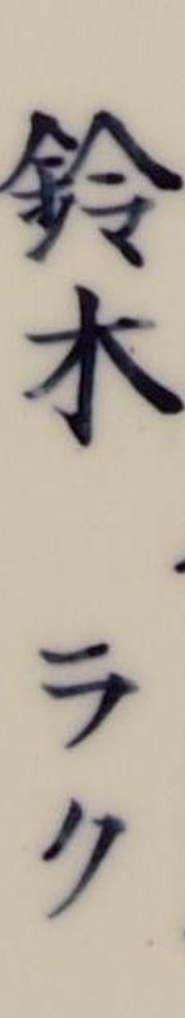鈴木ラク
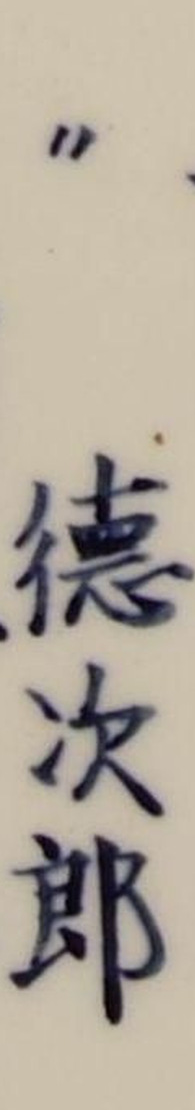徳次郎
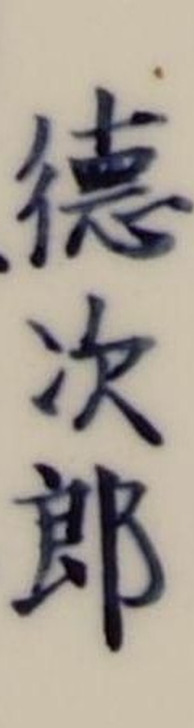徳次郎
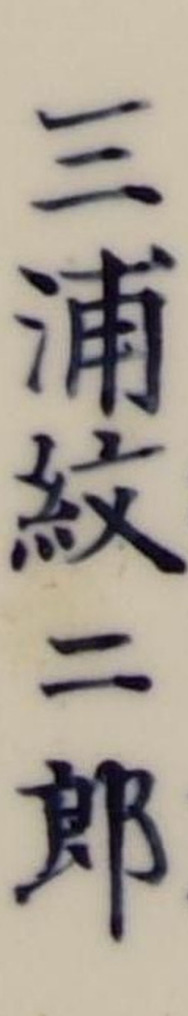三浦紋二郎
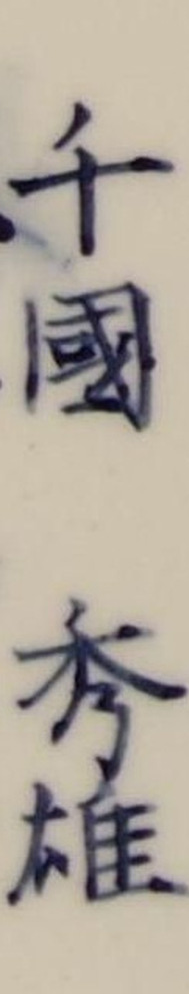千国秀雄
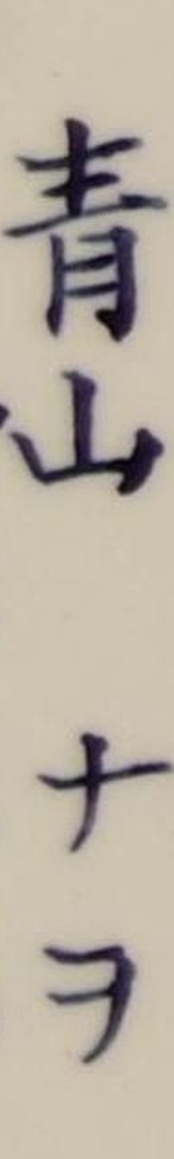青山ナヲ
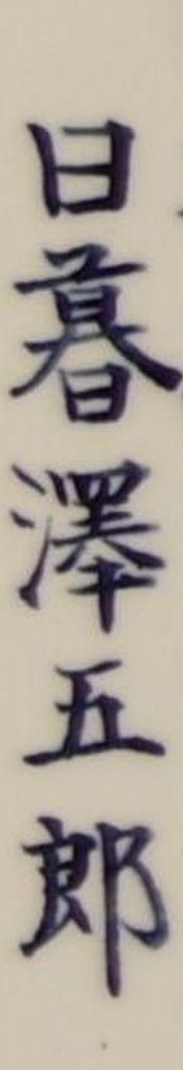日暮澤五郎

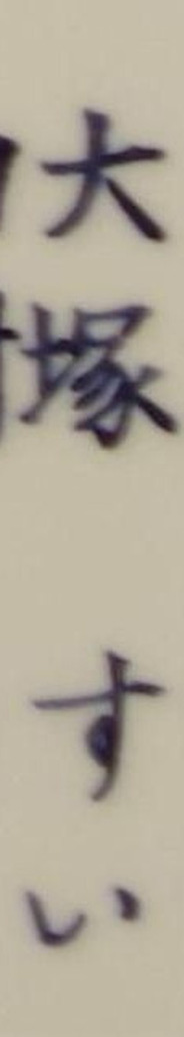大塚すい
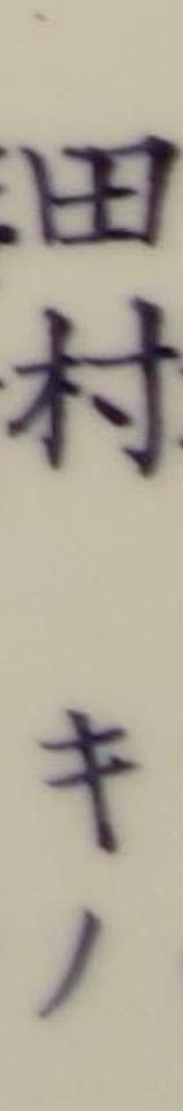田村キノ
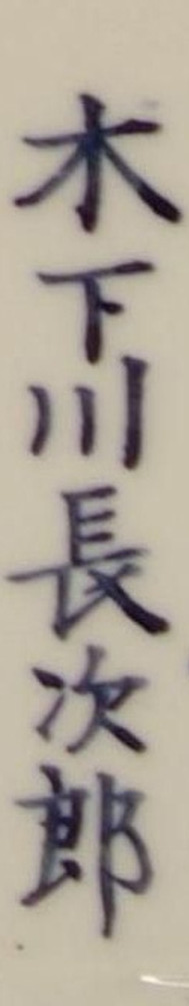木下川長次郎
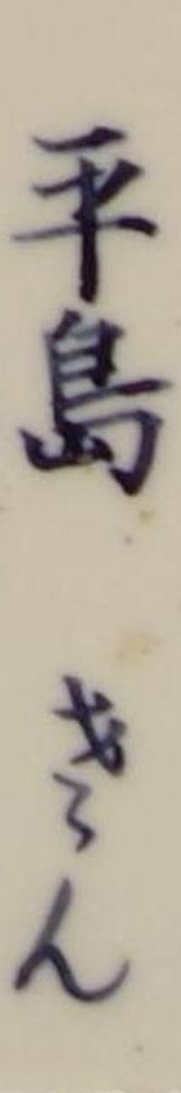平島さん
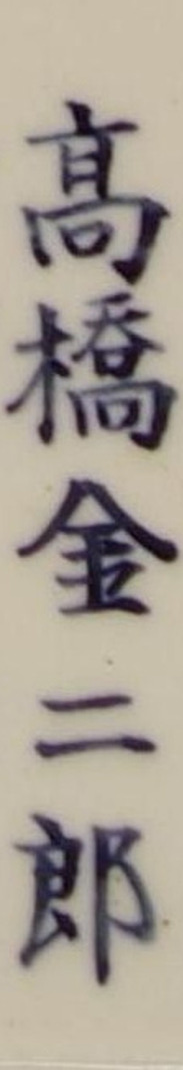高橋金二郎
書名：E~L
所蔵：高野山金剛峯寺
